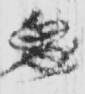{胃刀}（謂）
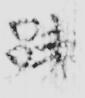邞
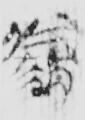○（拳）
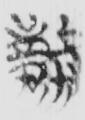○（竊）
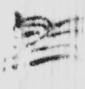馬
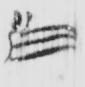於
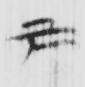下
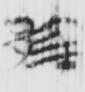蔡
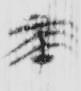而
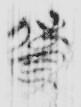儥
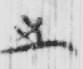之
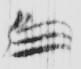於
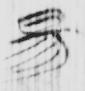昜（陽）
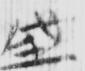城
